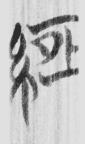絚
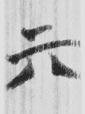亓
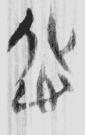{化心}
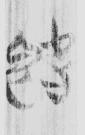既
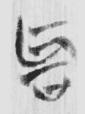{㠯ㅋ}
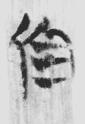於
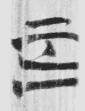正
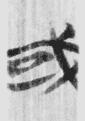或
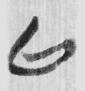㠯（以）
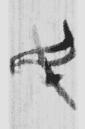民
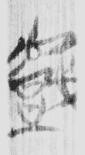戲
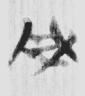凡
